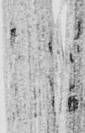○（吾）
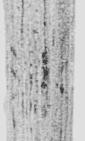未
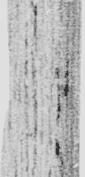見
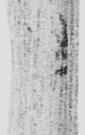邦
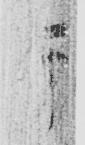而
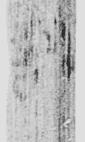信
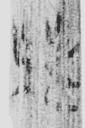○（者）
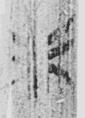未
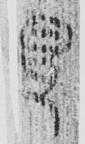見
